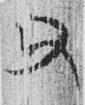父
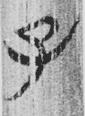子
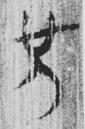兄
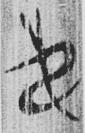弟
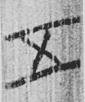五
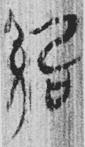○（紀）
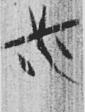必（畢）
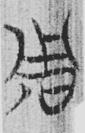周
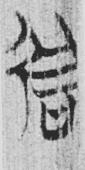唯（雖）
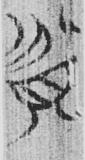貧
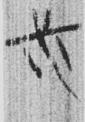必
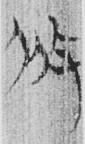攸（修）
